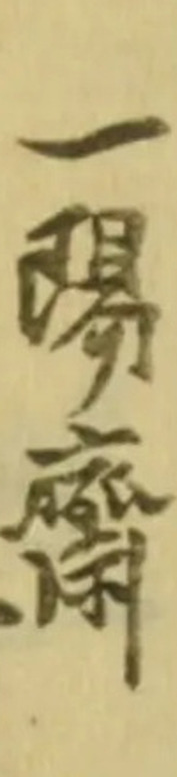一陽斎
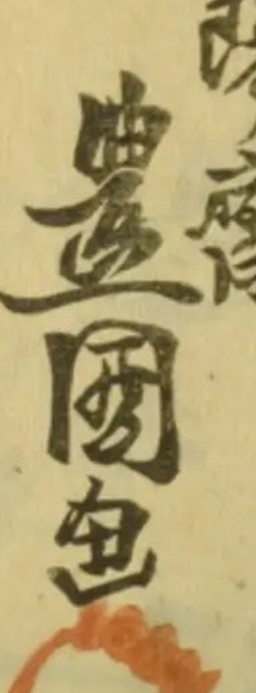豊国画
